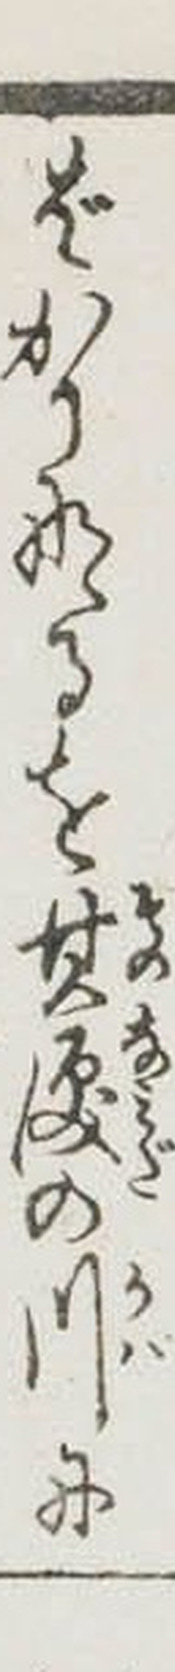ばかりなるを其涙の川に
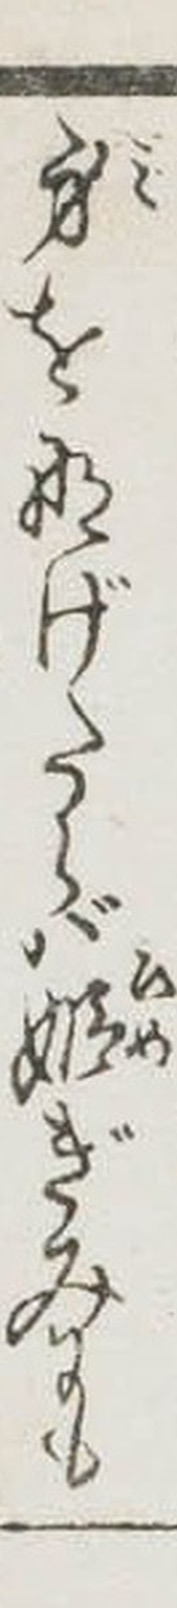身をなげたらば姫ぎみにも
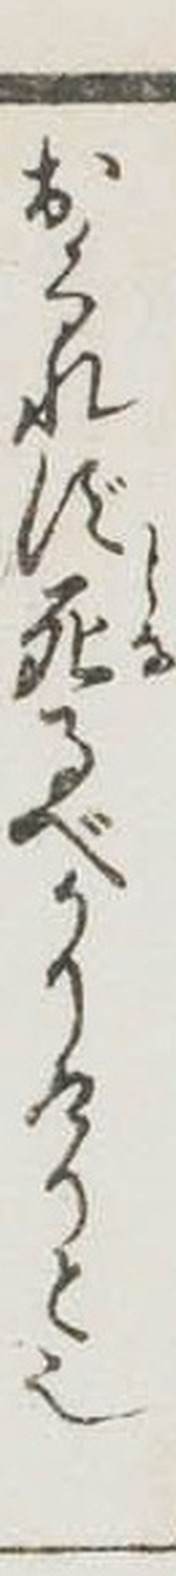おくれず死るべかりけりと也
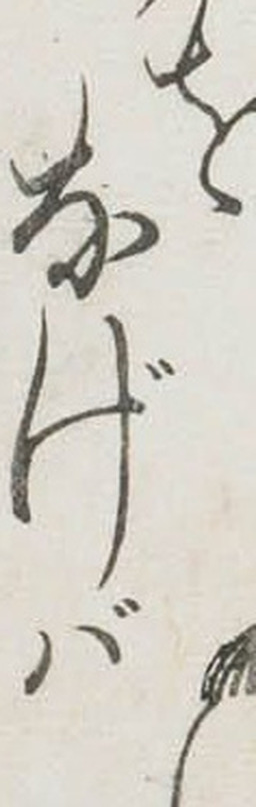なげば
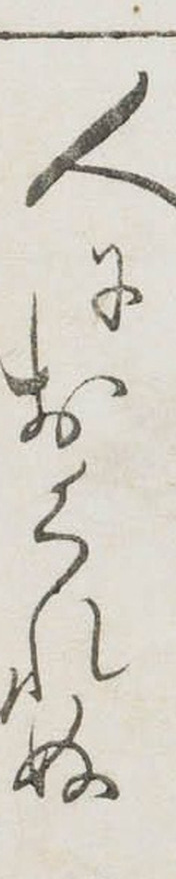人におくれぬ
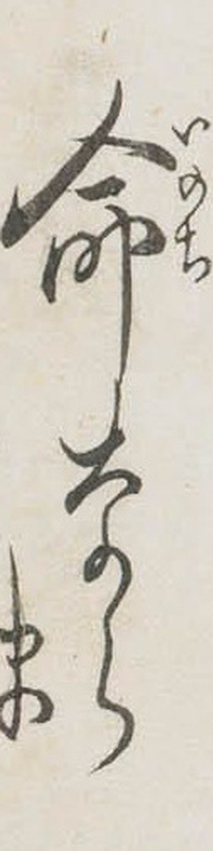命なら

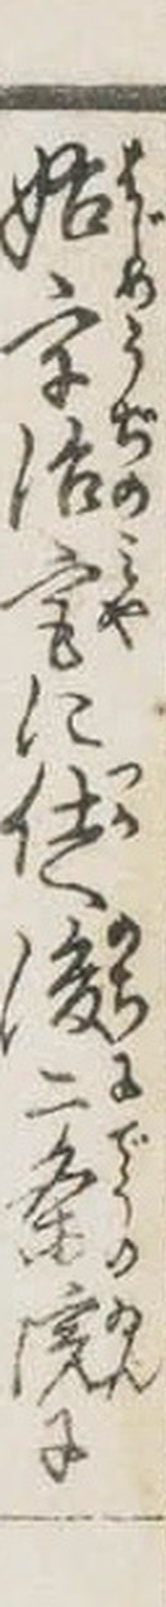始宇治宮に仕へ後二条院に
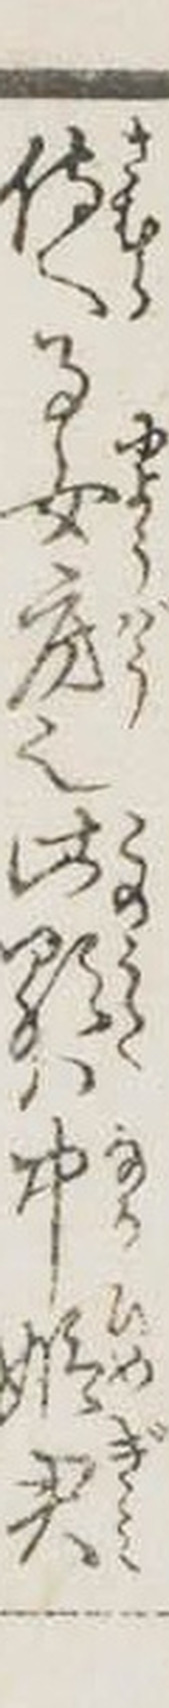侍へる女房也此歌は中姫君
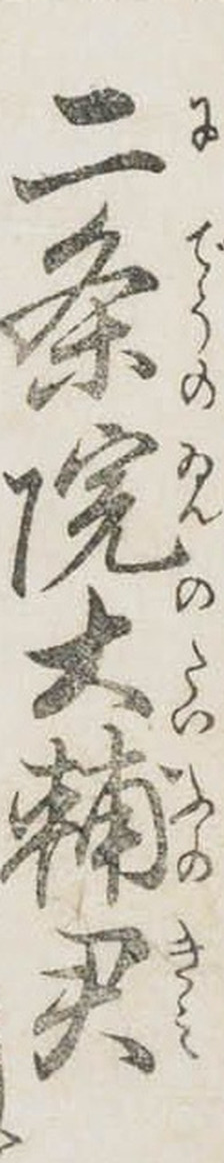二条院大輔君
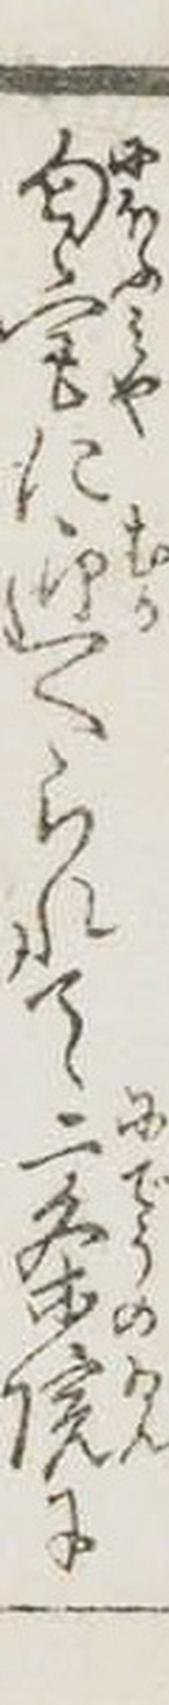匂宮に迎へられて二条院に
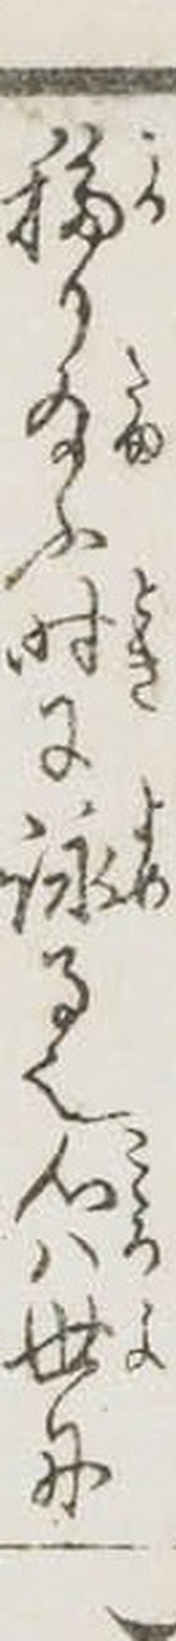移り給ふ時に詠る也心は世に
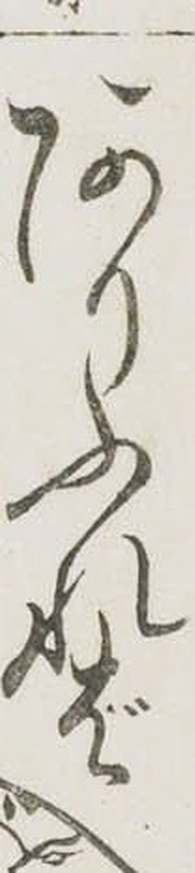ありふれば
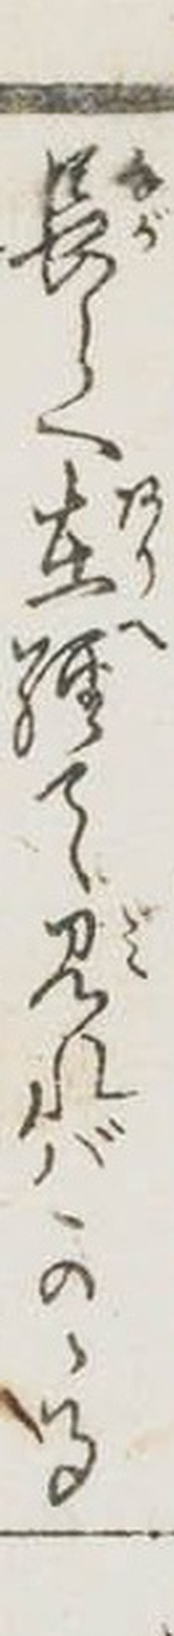長しく在経て見ればかゝる
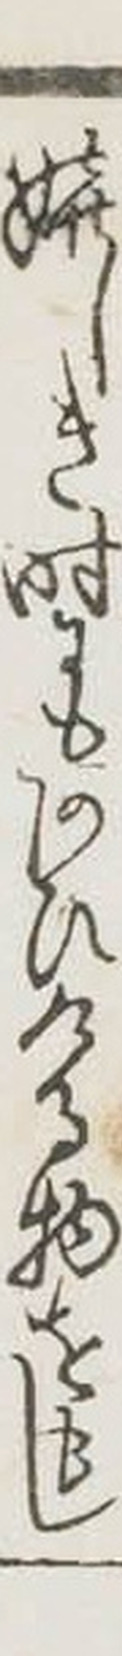嬉しき時にもあひける物をもし
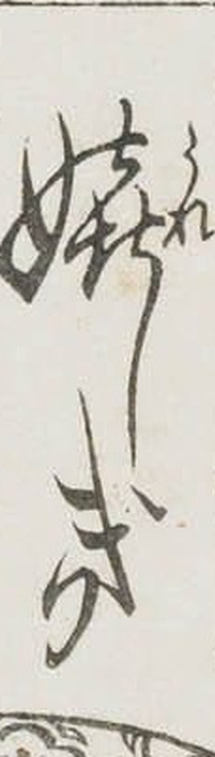嬉しき
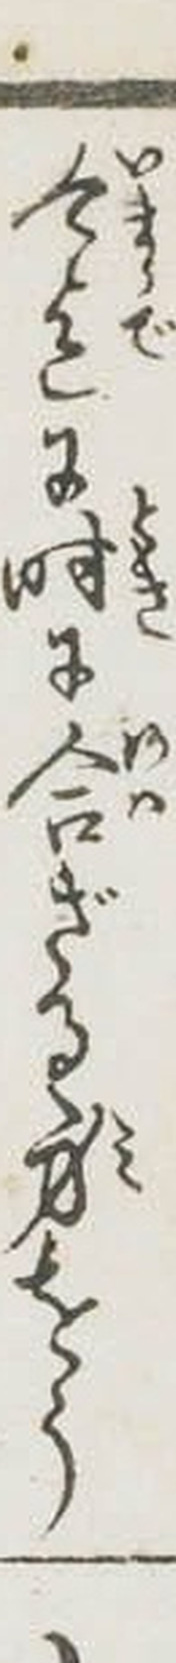今迄に時に合ざる身をう
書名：源氏百人一首
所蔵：東京学芸大学教育コンテンツアーカイブ
